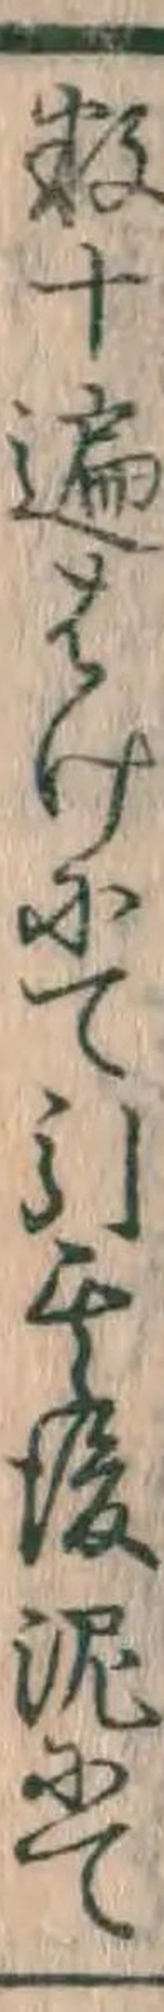数十遍はけにて引其後泥にて
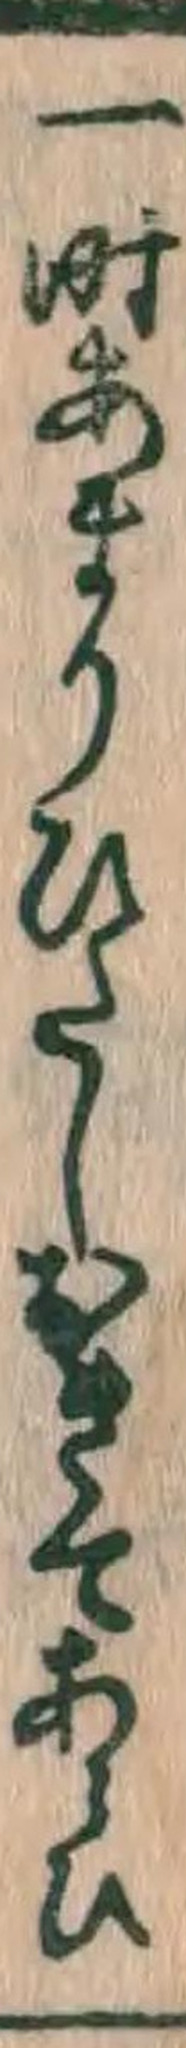一時あまりひたしおきてあらひ
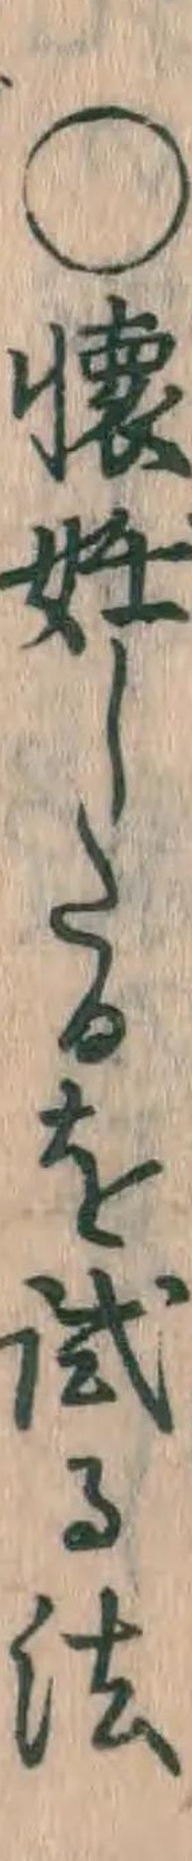○懐妊したるを試る法
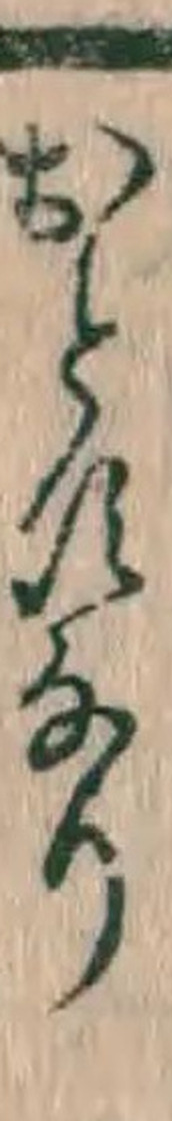おとすなり
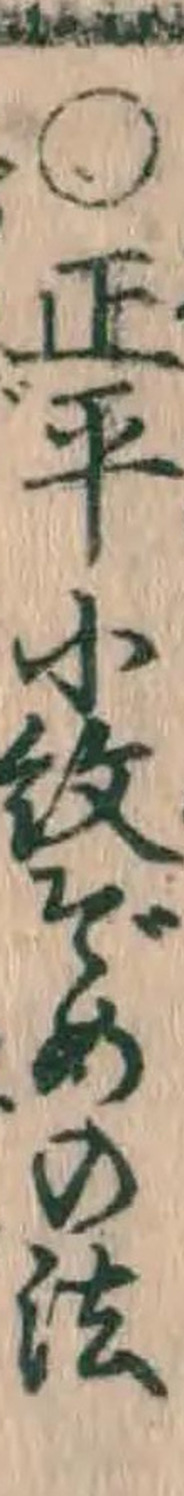○正平小紋ぞめの法
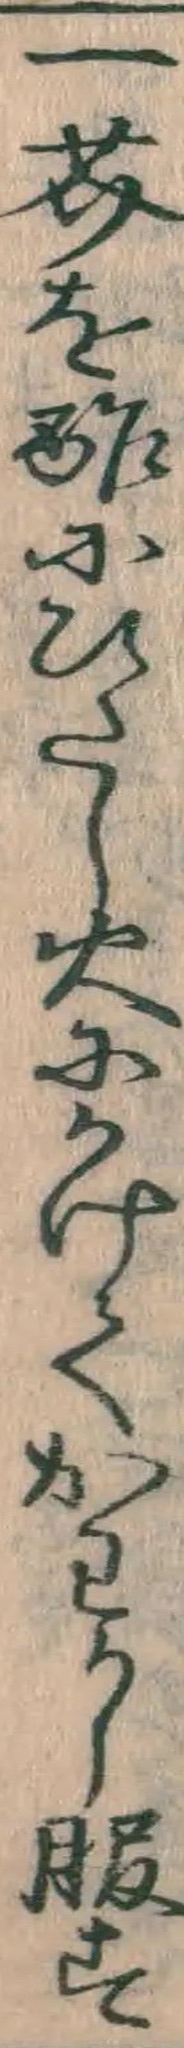一芥を酢にひたし火にかけてかわかし服す
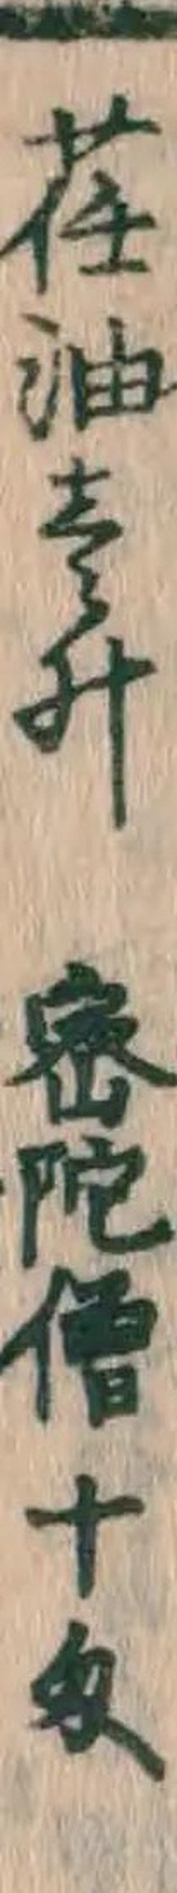荏油壱升密陀僧十匁
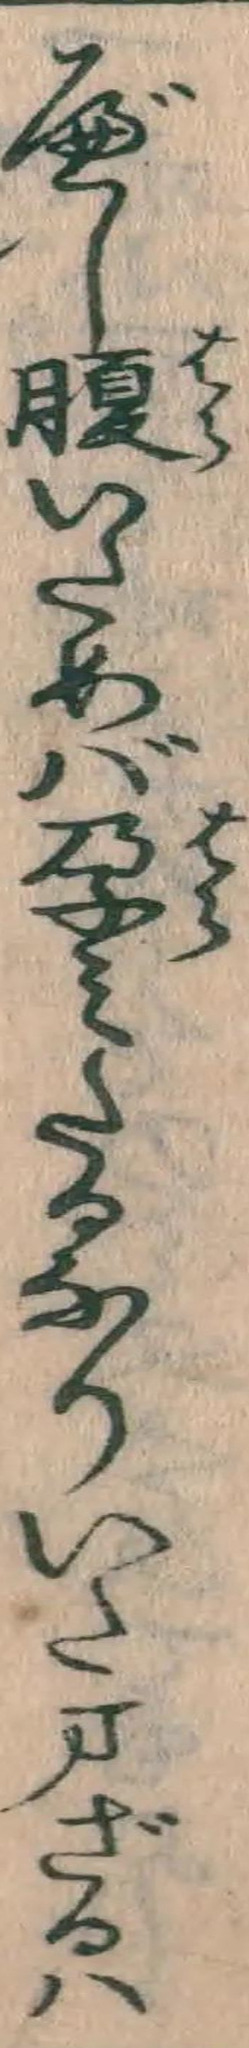べし腹いためば孕みたるなりいたまざるは
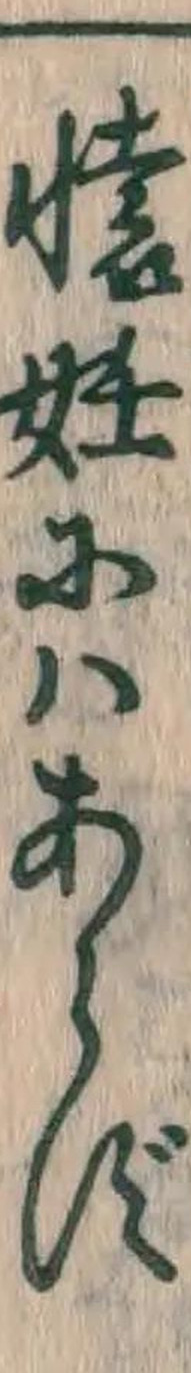懐妊にはあらず
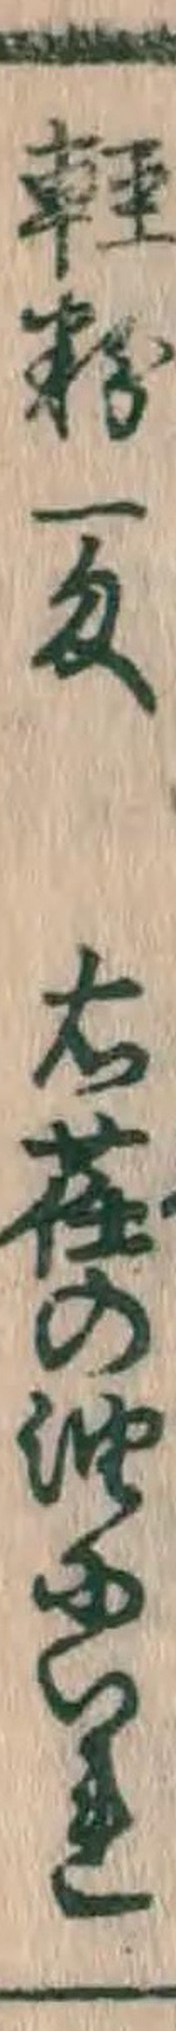軽粉一匁右荏の油にいれ
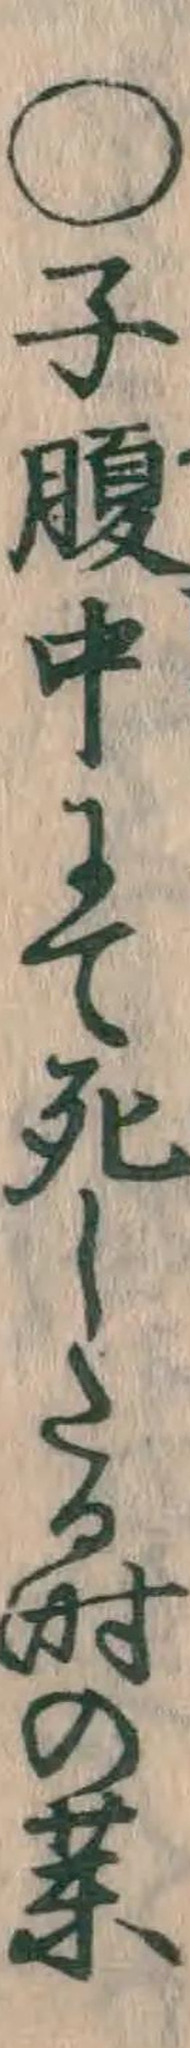○子腹中にて死したる時の薬
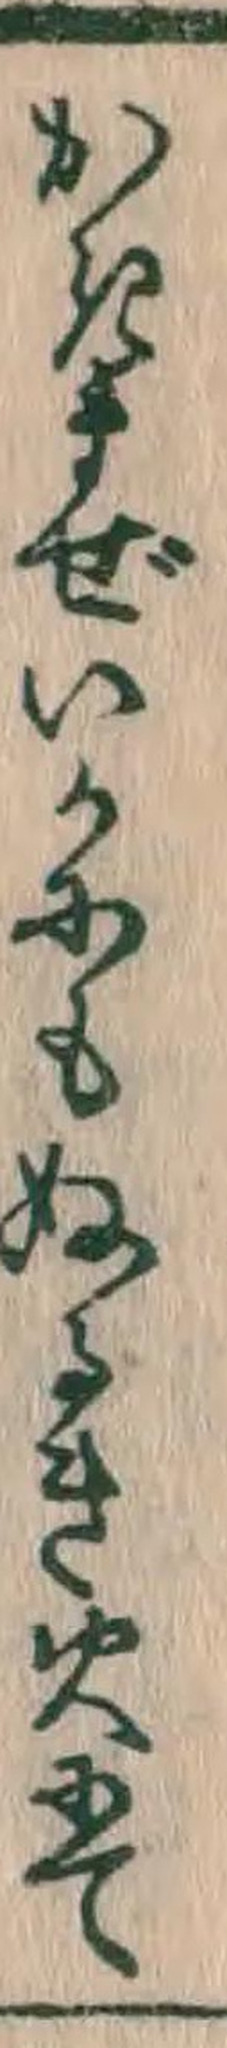かきまぜいかにもぬるき火にて
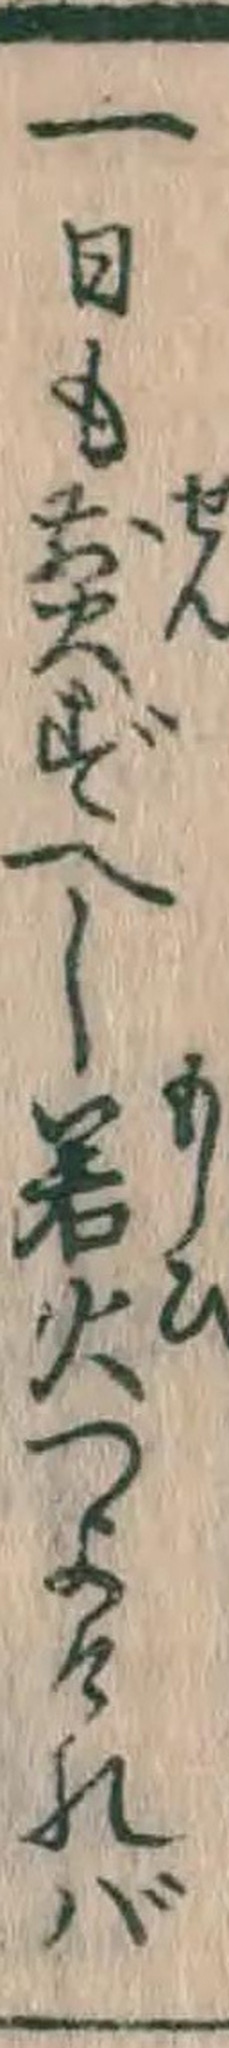一日も煎ずへし若火つよければ
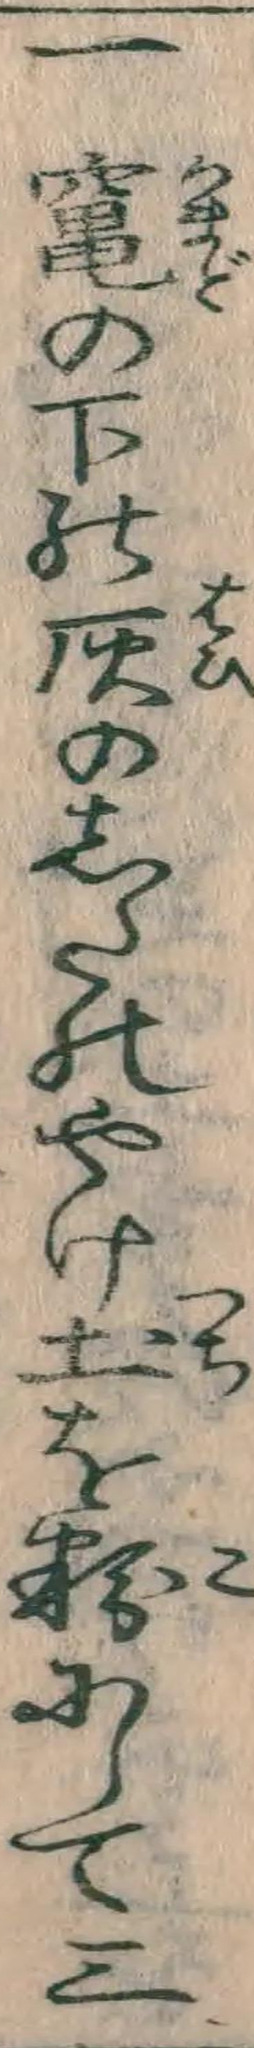一竈の下の灰のしたのやけ土を粉にして三
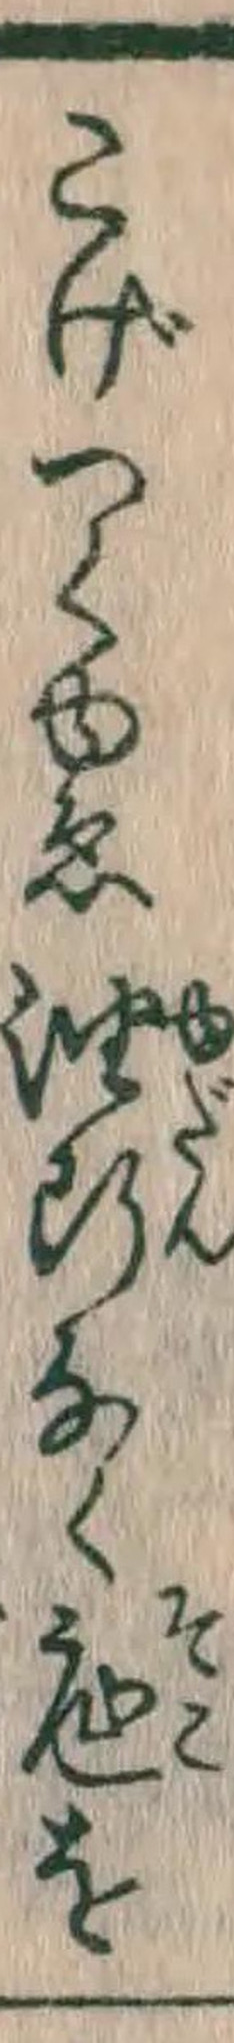こげつくゆゑ油断なく底を
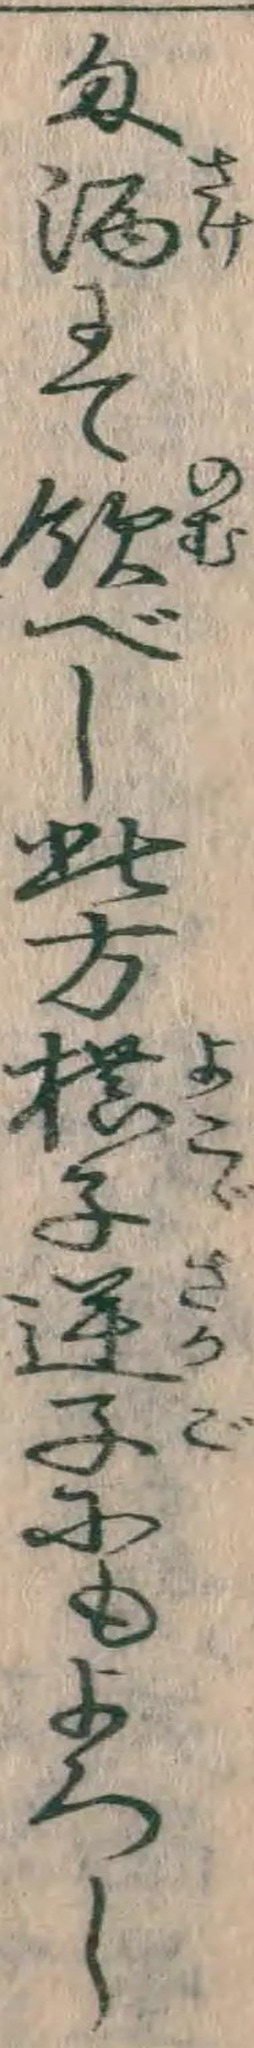匁酒にて飲べし此方横子逆子にもよろし
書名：広益秘事大全 3巻. [3]
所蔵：国立国会図書館 National Diet Library, JAPAN
